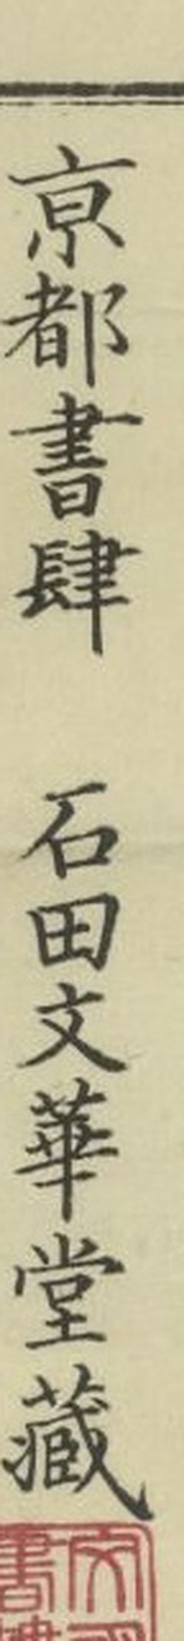京都書肆石田文華堂藏

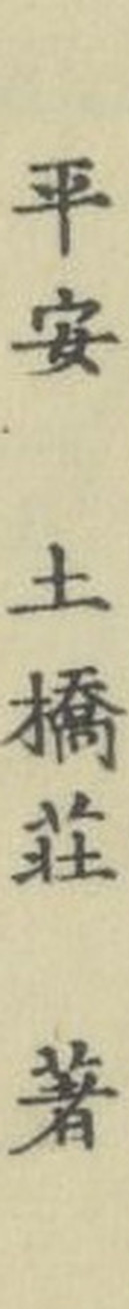平安土橋荘著
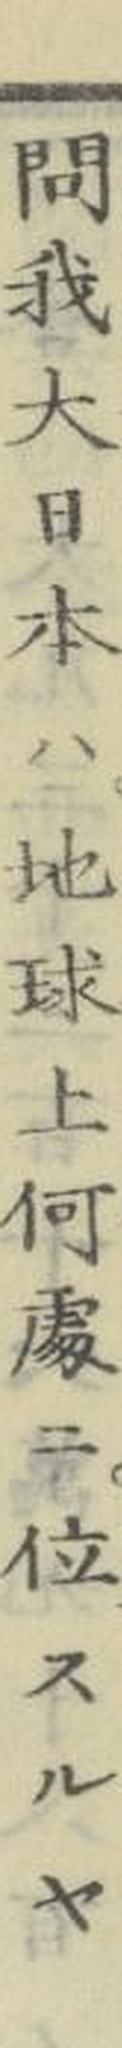問我大日本ハ。地球上何䖏ニ。位スルヤ
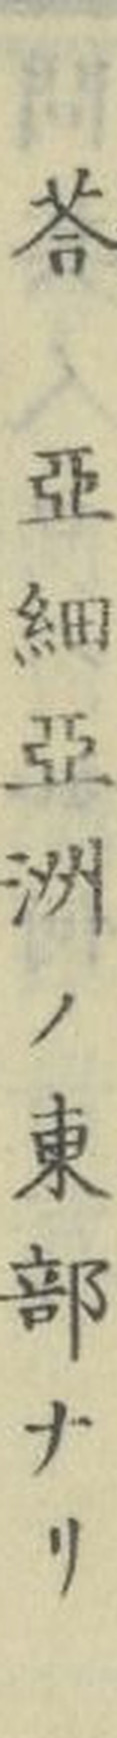答亞細亞洲ノ東部ナリ
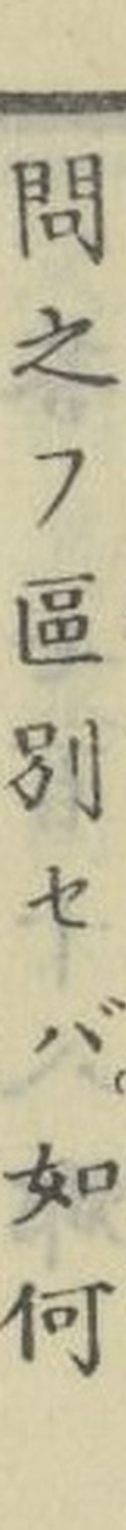問之フ區別セバ。如何
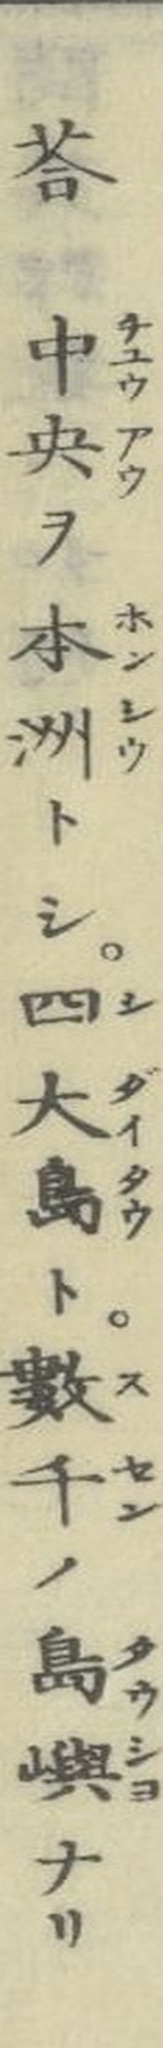答中央ヲ本洲トシ。四大島ト。數千ノ島嶼ナリ
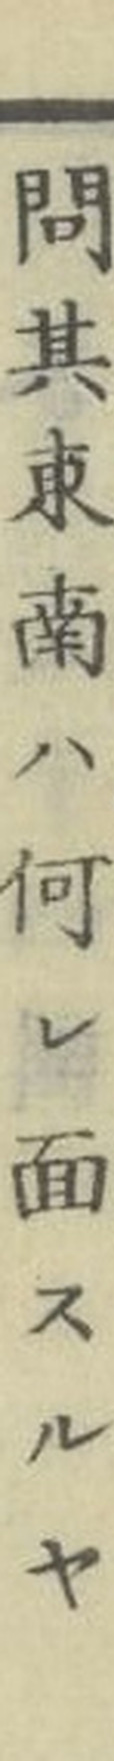問其東南ハ。何レ面スルヤ
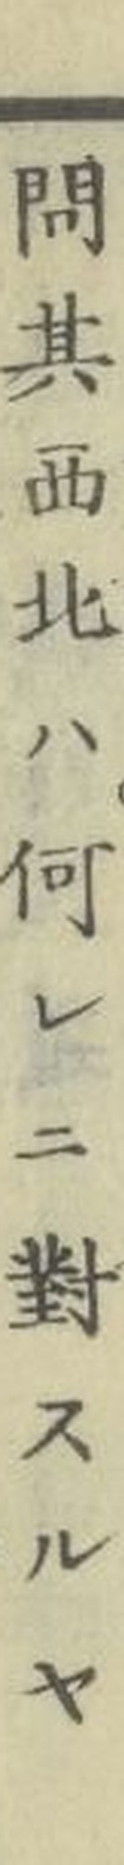問其西北ハ。何レニ對スルヤ
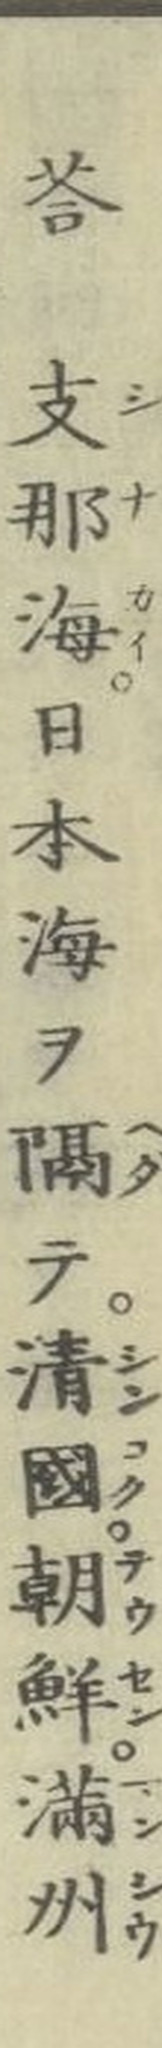答支那海。日本海ヲ隔テ。清國。朝鮮。滿州
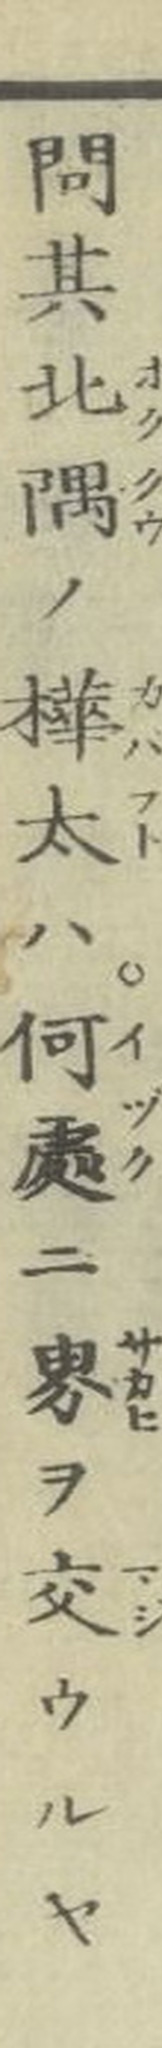問其北隅ノ樺太ハ。何處ニ界ヲ交ウルヤ

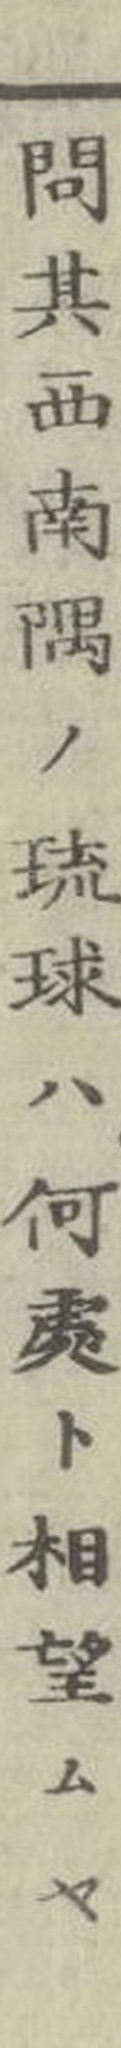問其西南隅ノ琉球ハ。何處ト相望ムヤ
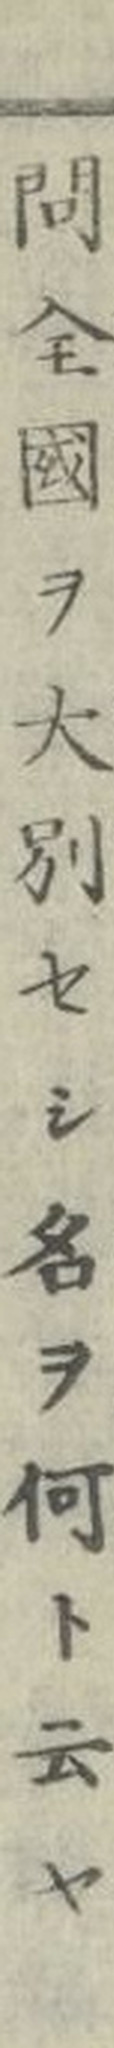問全國ヲ大別セシ名ヲ。何ト云ヤ
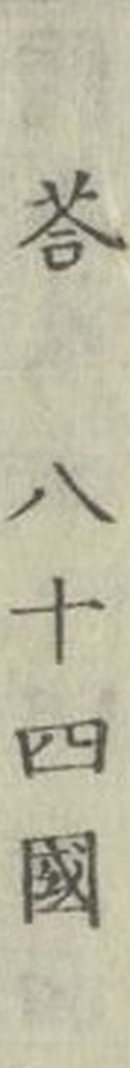答八十四國
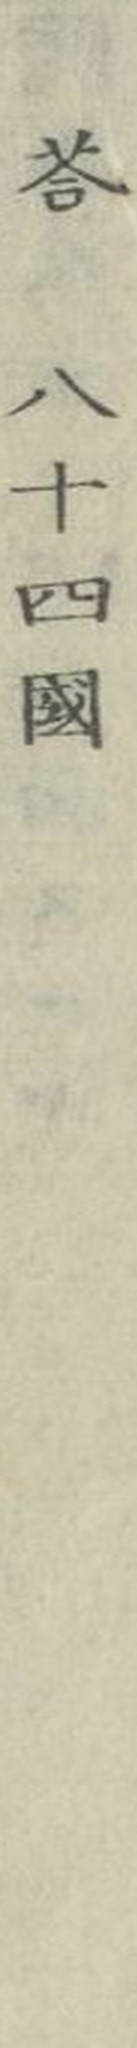答八十四國
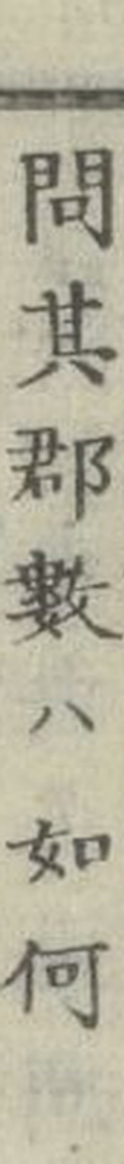問其郡數ハ如何
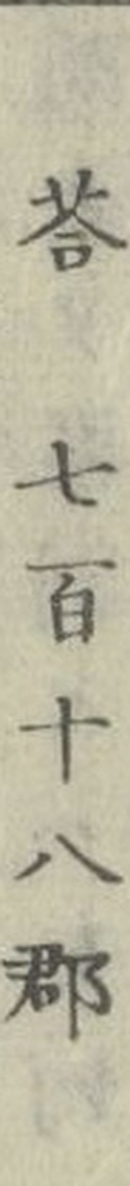答七百十八郡
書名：下等小学日本地誌略図問答 巻上 畿内東海道之部
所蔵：University of the Ryukyus Library
